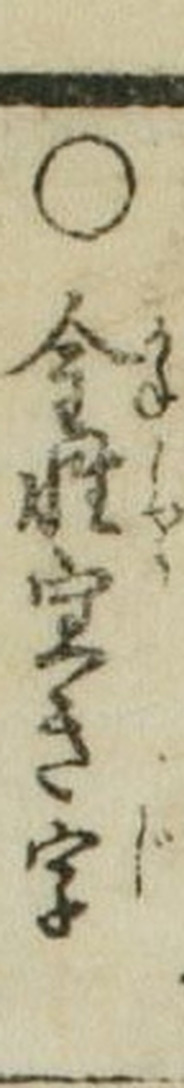○金性宜き字
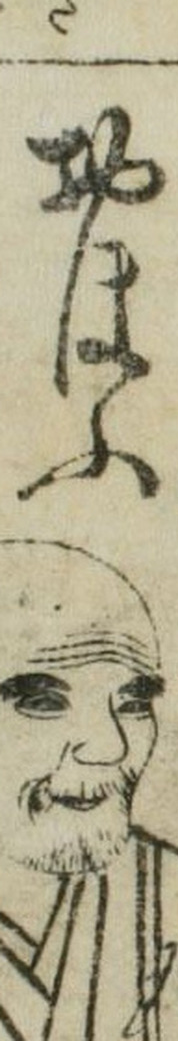おほふ
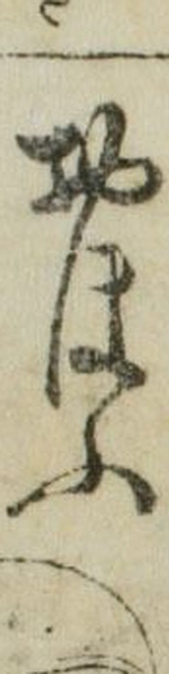おほふ
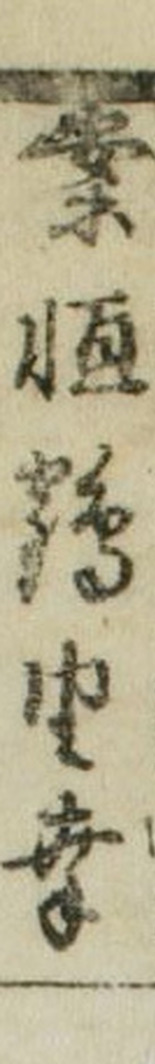案恒鶴由幸
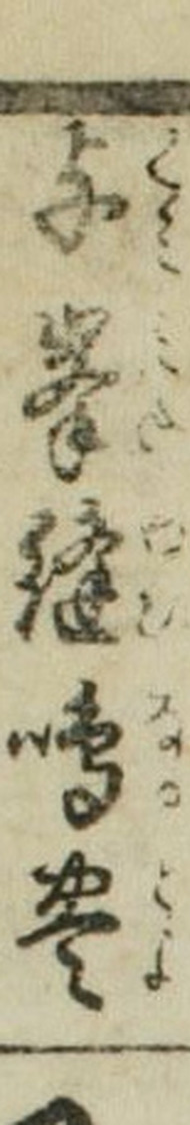与峯縫鳴豊
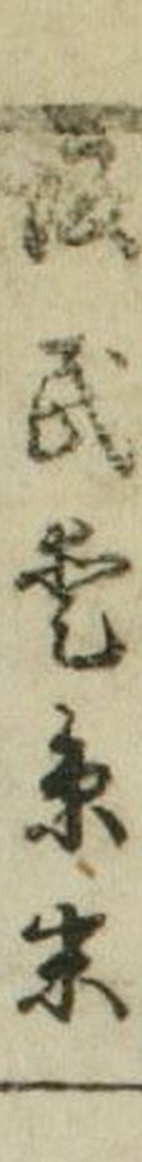坂民愛糸末
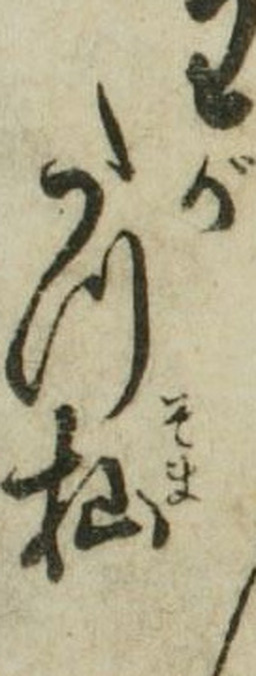たつ杣
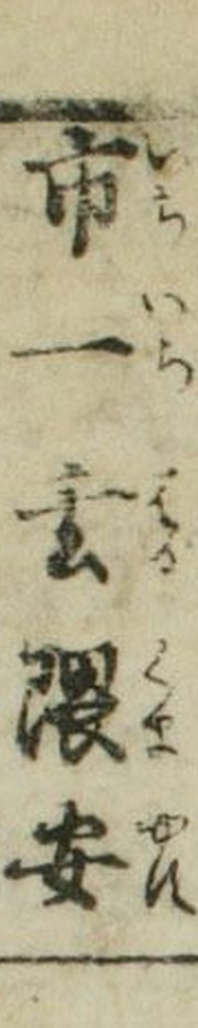市一玄隈安
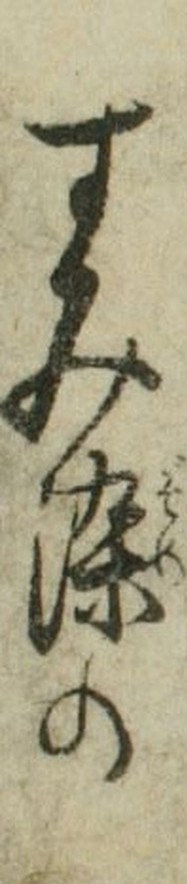すみ染の
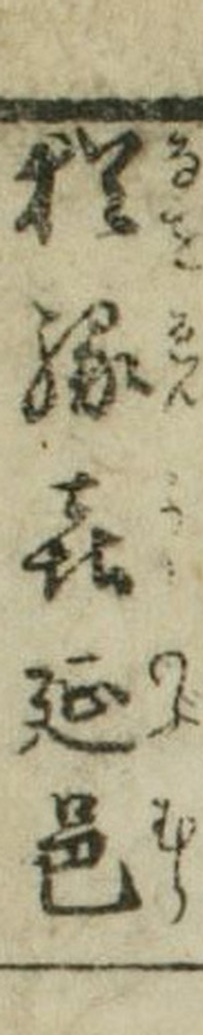猶縁喜延邑

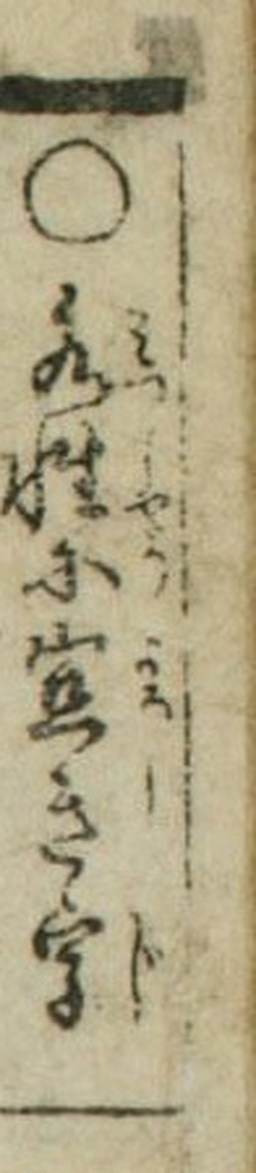○水性に宜き字
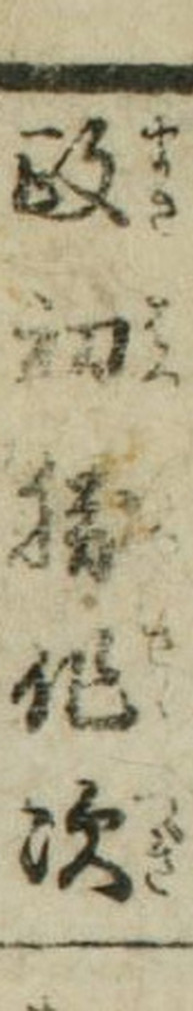政初勝作次
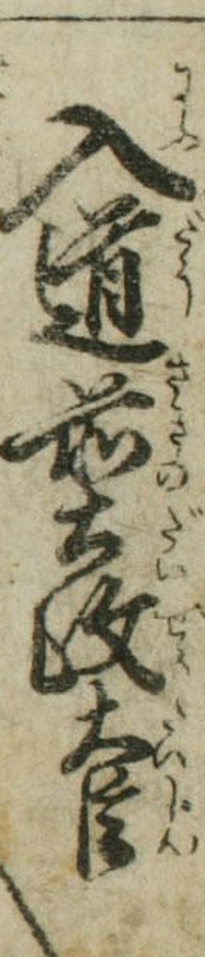入道前大政大臣
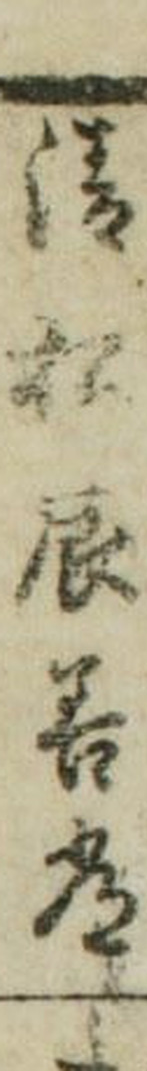清松辰善常
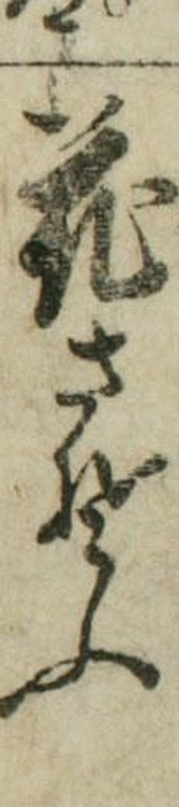花さそふ
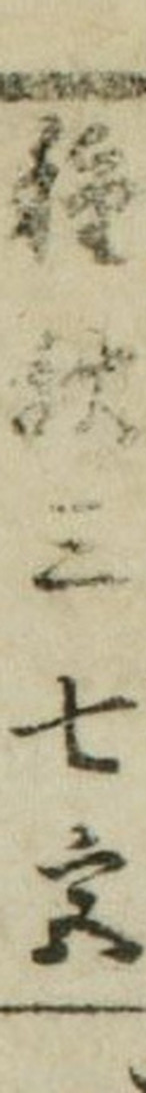種秋三七宮
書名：百人一首
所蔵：東京学芸大学教育コンテンツアーカイブ
